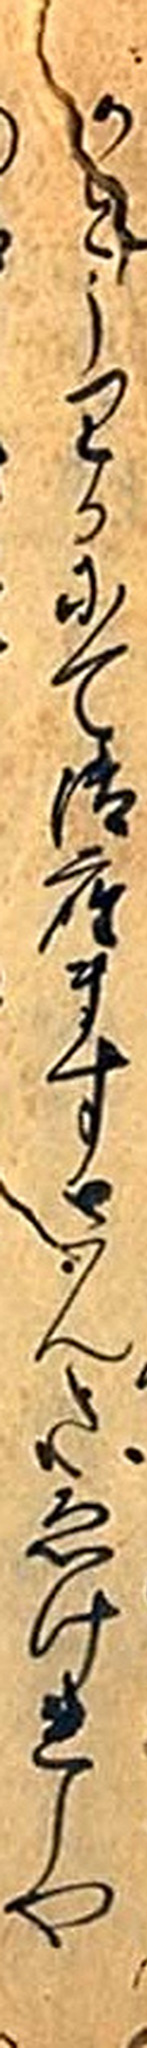かとうりかにて御座ますさんたゑけれしや
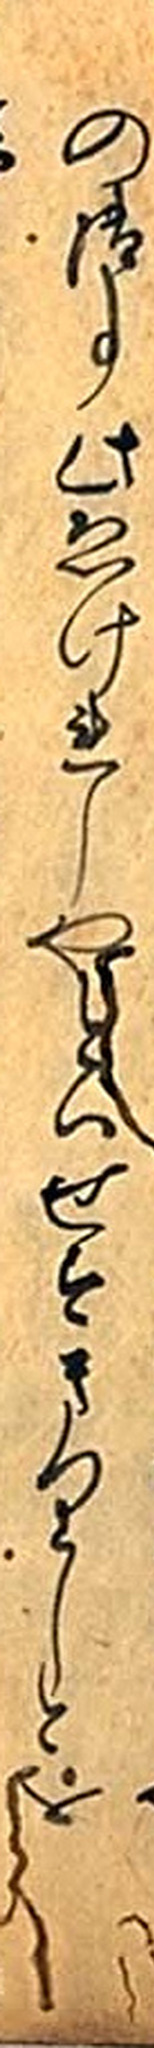の御事此ゑけれしやとはせすきりしとを
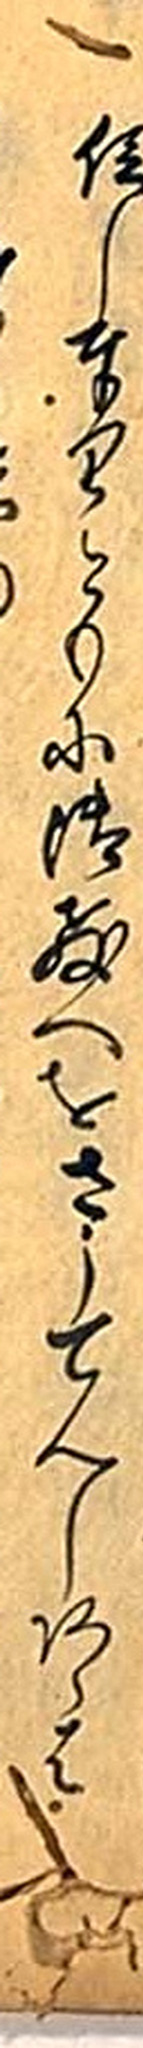信し奉りともに御教へをさうてんしあらは
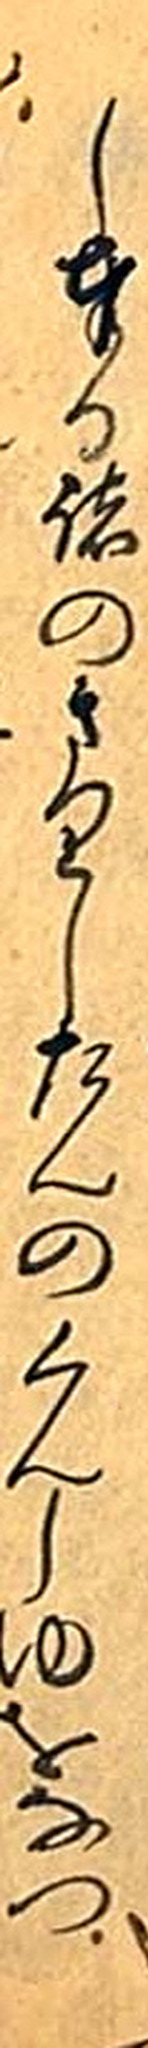し奉る緒のきりしたんのくんしゆをなつ
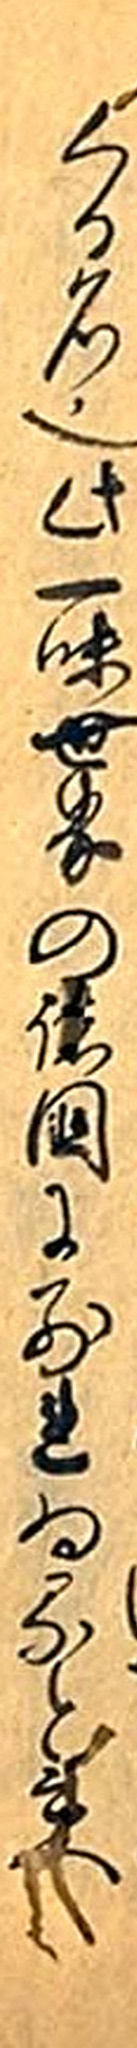くる名也此一味世界の諸国に別れゐると云へ
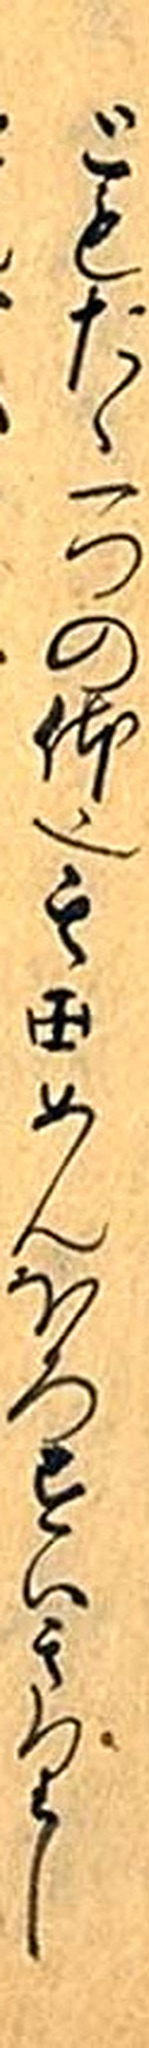ともたゝ一つの体也其☩めんほろすはきりし
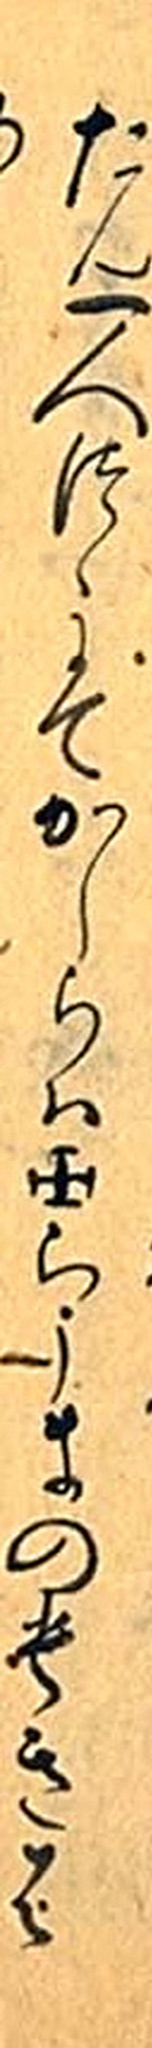たん一人つゝにてかしらは☩らうまの貴きは
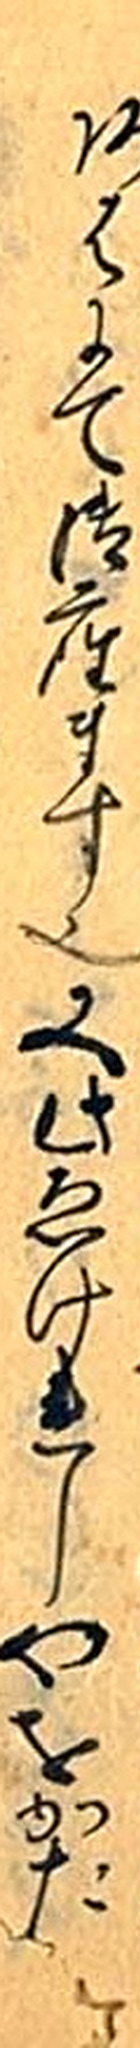あはにて御座ます也又此ゑけれしやをかた
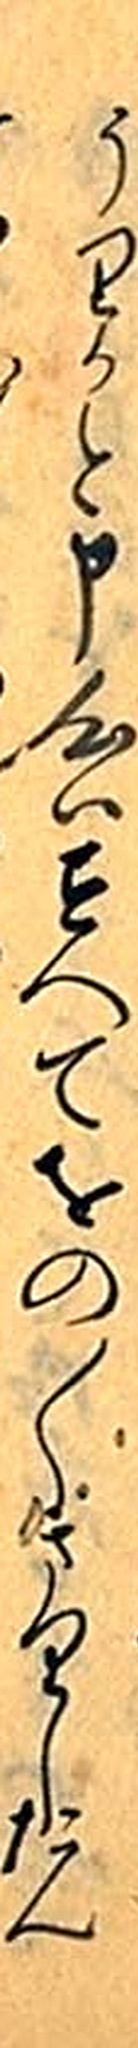うりかと申心はすへてをの〳〵きりしたん
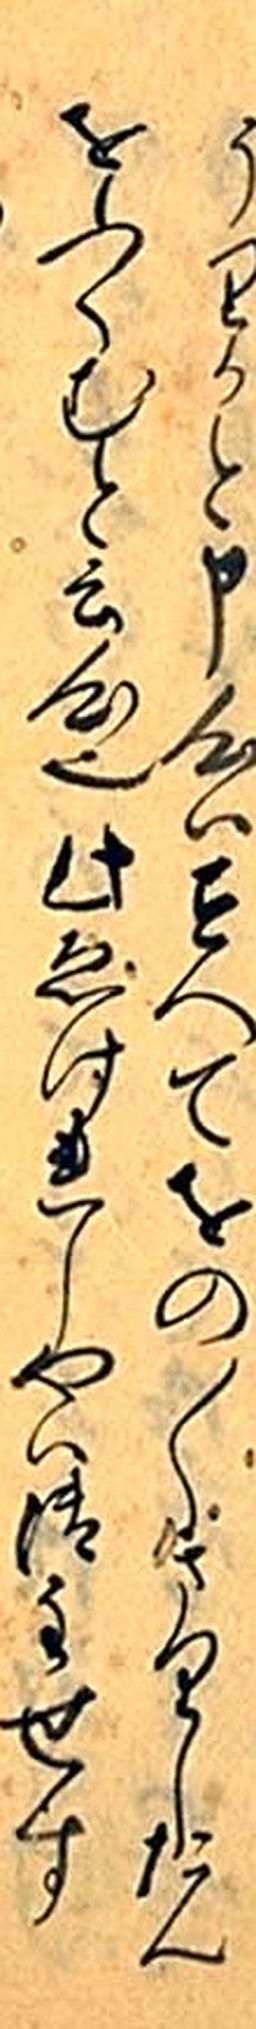をふくむと云心也此ゑけれしやは御主せす
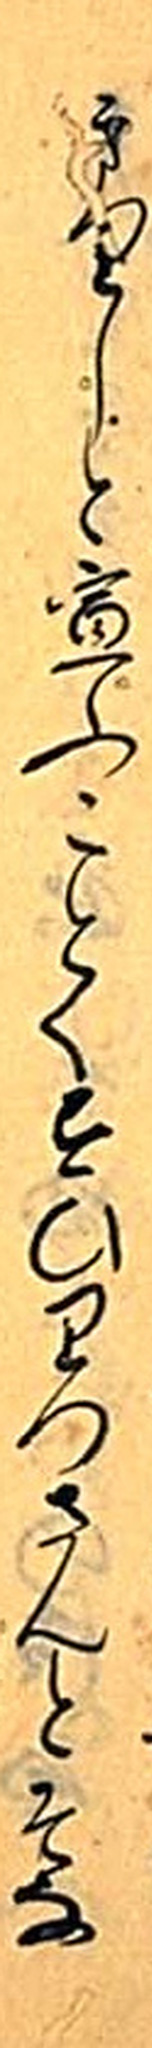きりしと宣ふことくすひりつさんとそな
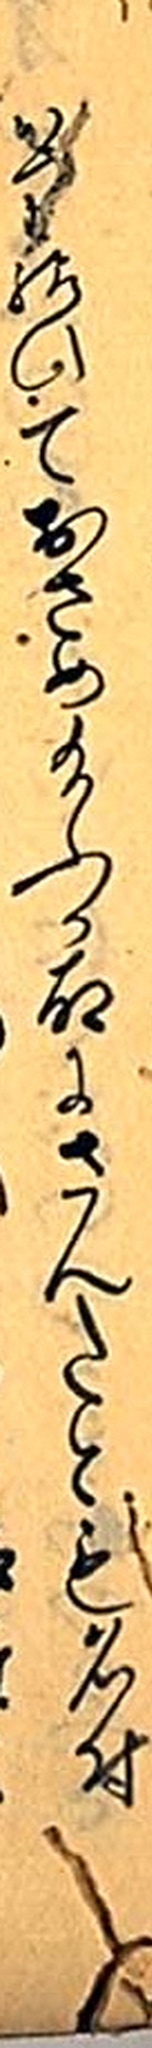はり給ひておさめ給ふか故にさんたとも名付
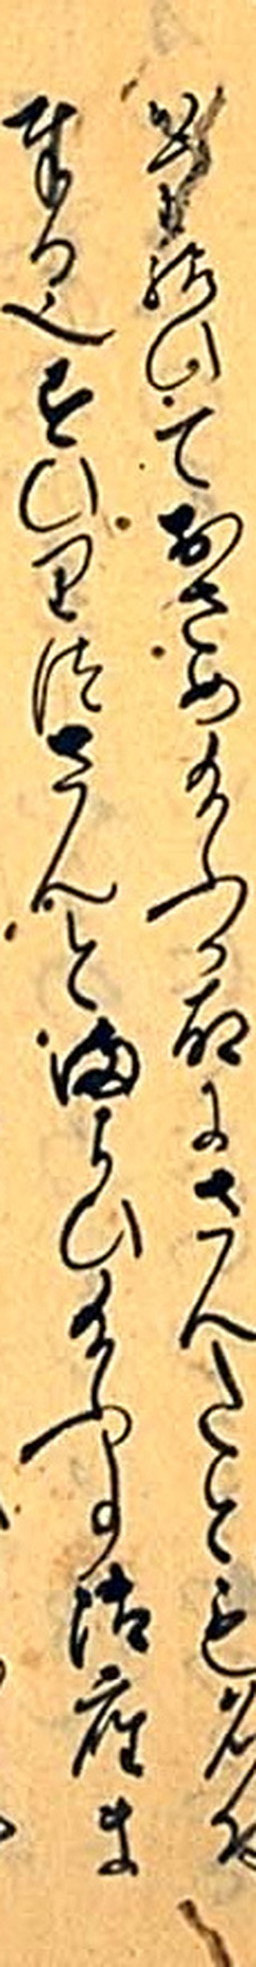奉る也すひりつさんとまよひ給ふ事御座ま
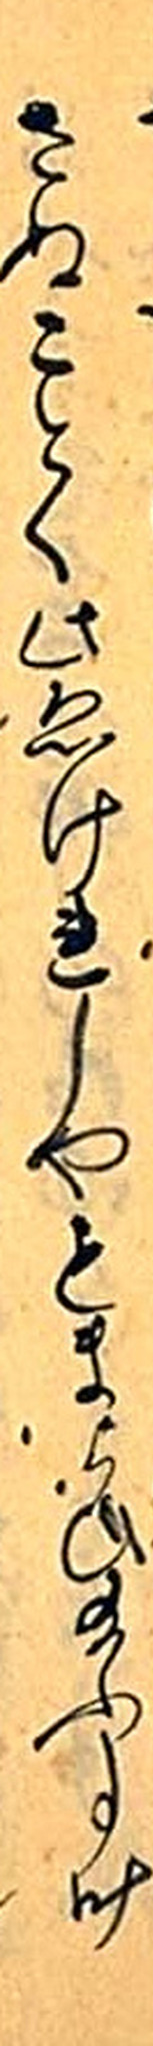さぬことく此ゑけれしやもまよひ給ふ事叶
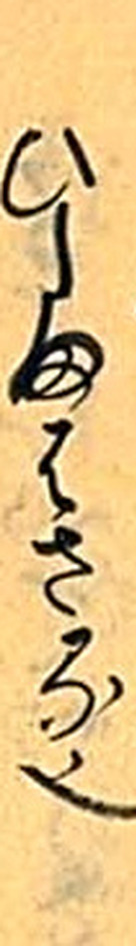ひたまはさる也
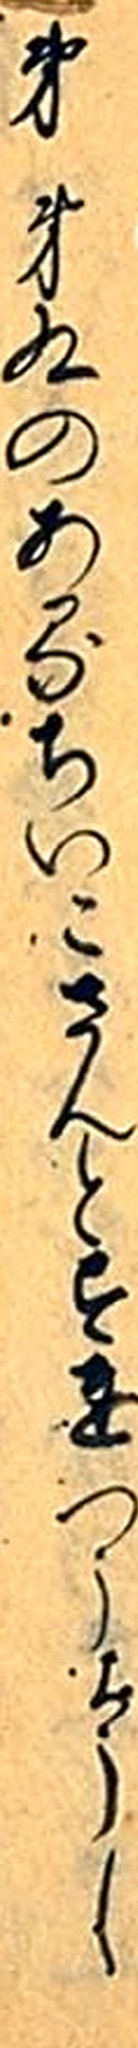弟第九のあるちいこさんとす達つうようし
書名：ドチリナ・キリシタン
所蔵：東京大学総合図書館 / General Library in the University of Tokyo
